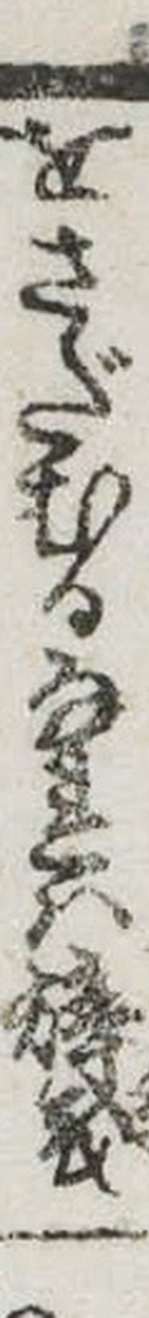をさだむるなれは辞義
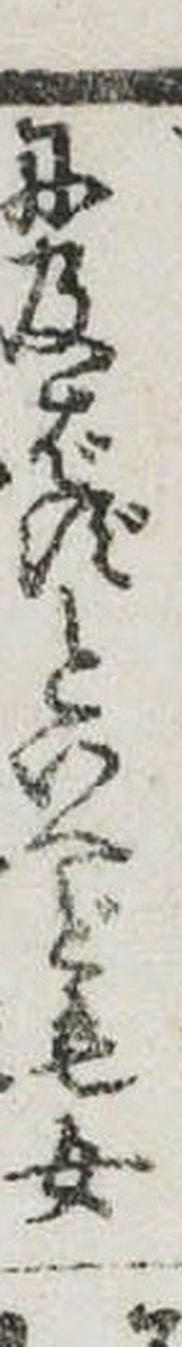に及ばずといへども女
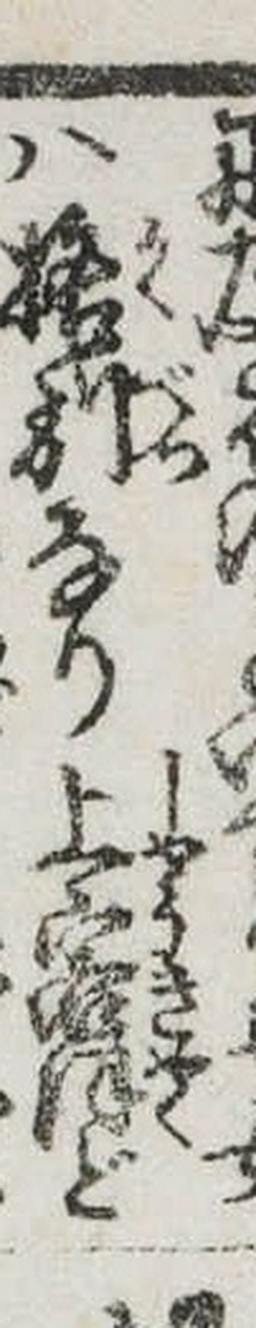は格別なり上客ほど
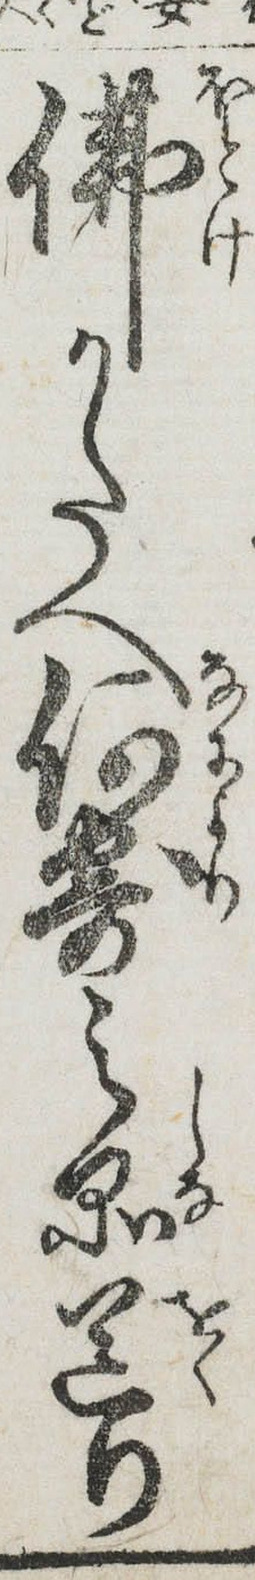仏かたへ何寄之品送り
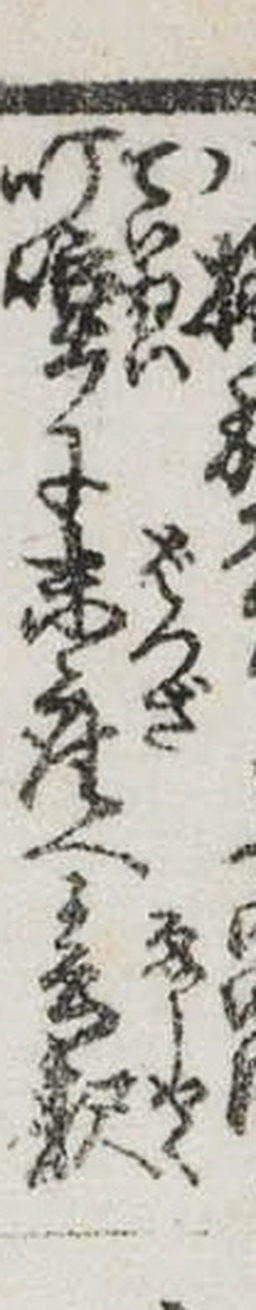叮嚀に末座へ会釈
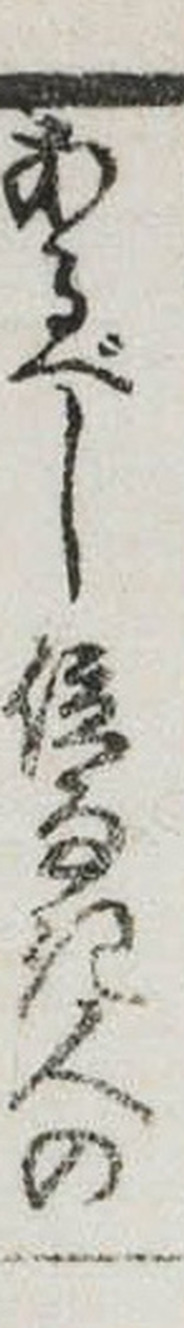あるべし位なき人の
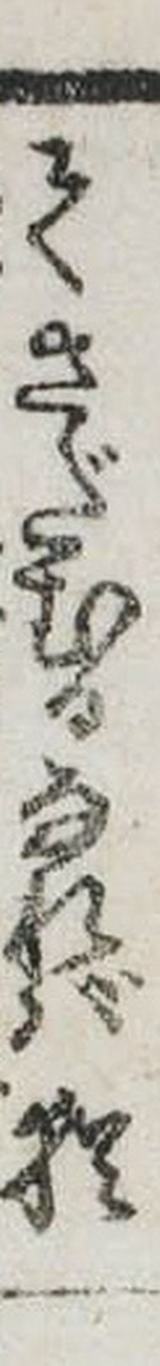てさだむるなれば猶
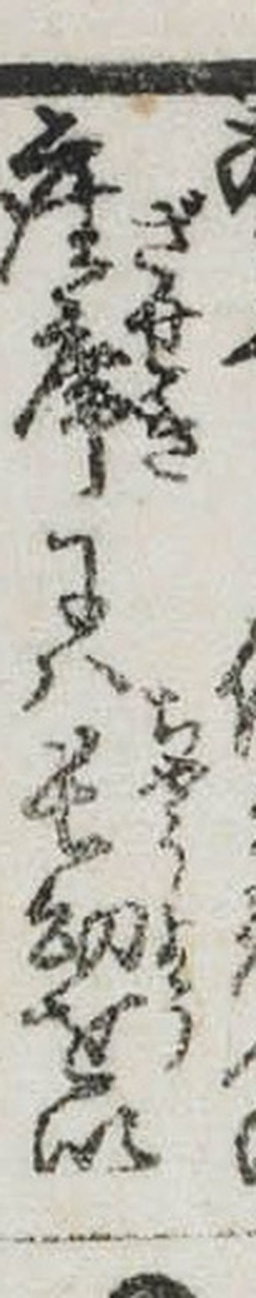座席には長幼を以
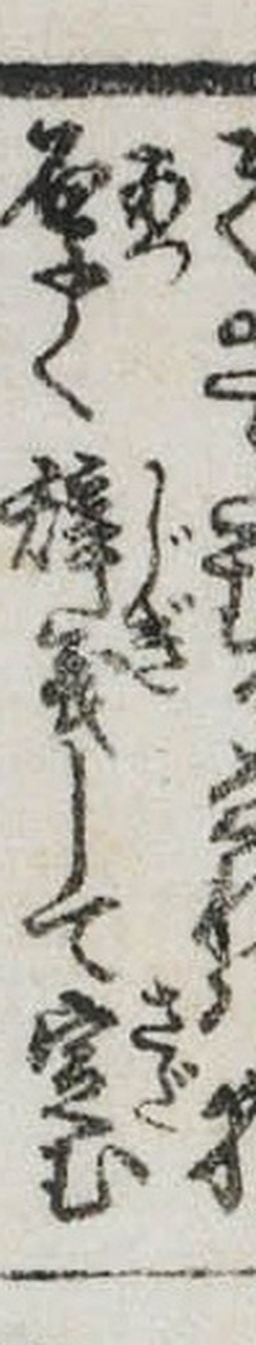厚く辞義して定む
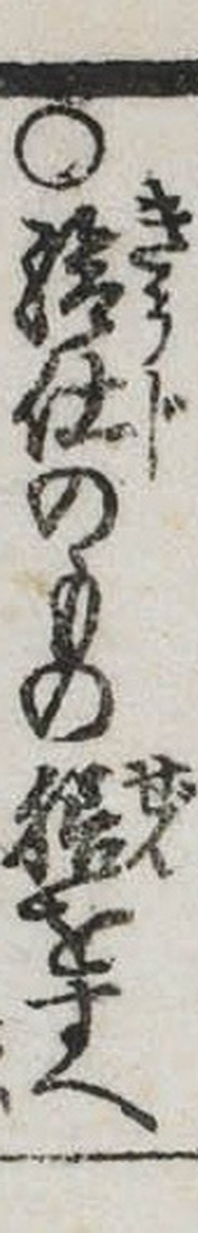○給仕のもの膳をすへ
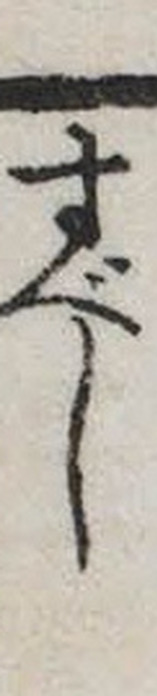すべし
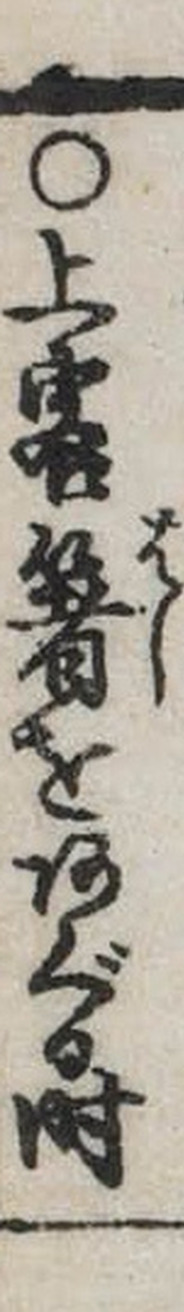○上客箸をあぐる時

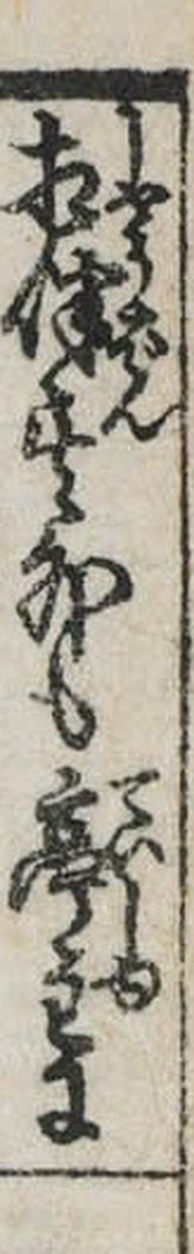相伴其外も亭主に
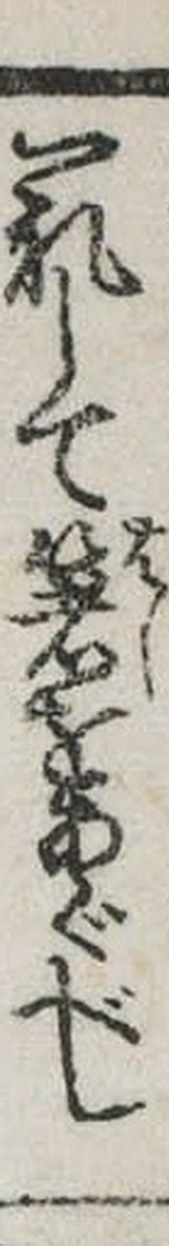一礼して箸をあぐべし
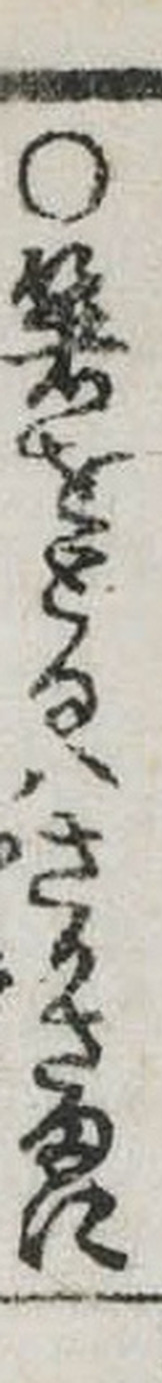○箸をとるはさかさまに
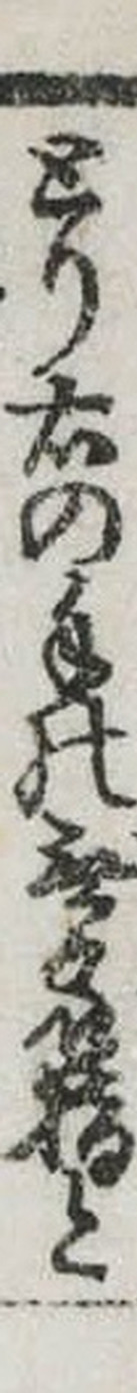とり右の手の無名指と
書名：頭書萬用婦人手紙之文言
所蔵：東京学芸大学教育コンテンツアーカイブ
